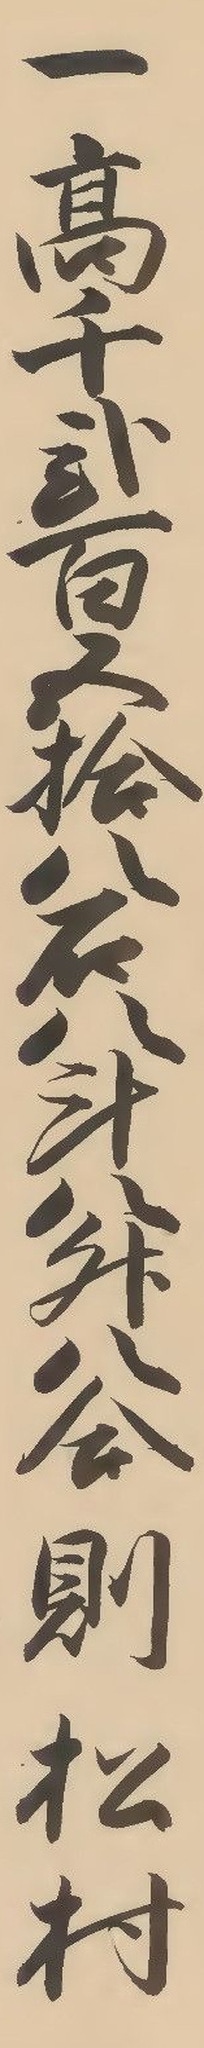一高千弐百五拾八石八斗八升八合則松村
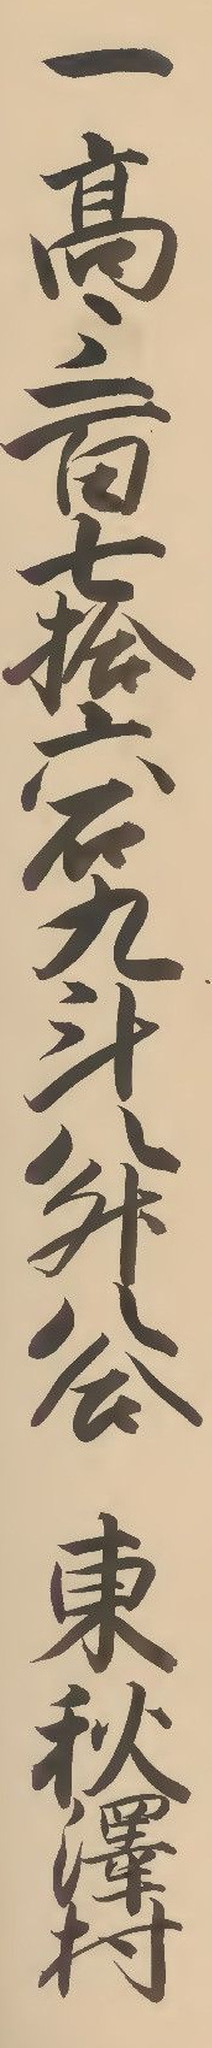一高三百七拾六石九斗八升八合東秋沢村
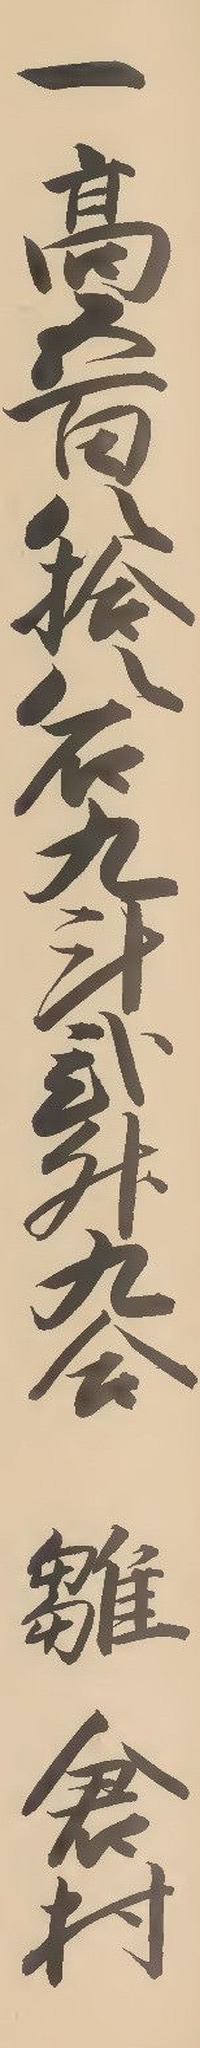一高五百八拾八石九斗弐升九合雛倉村
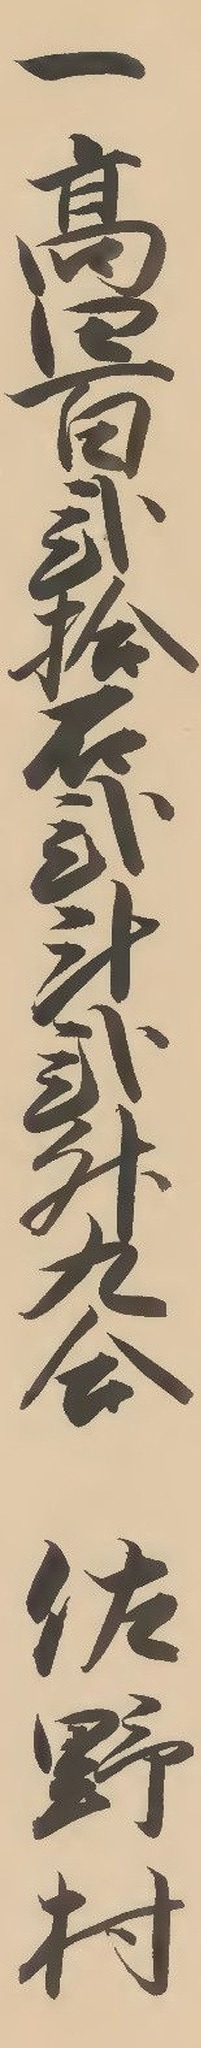一高四百弐拾石弐斗弐升九合佐野村
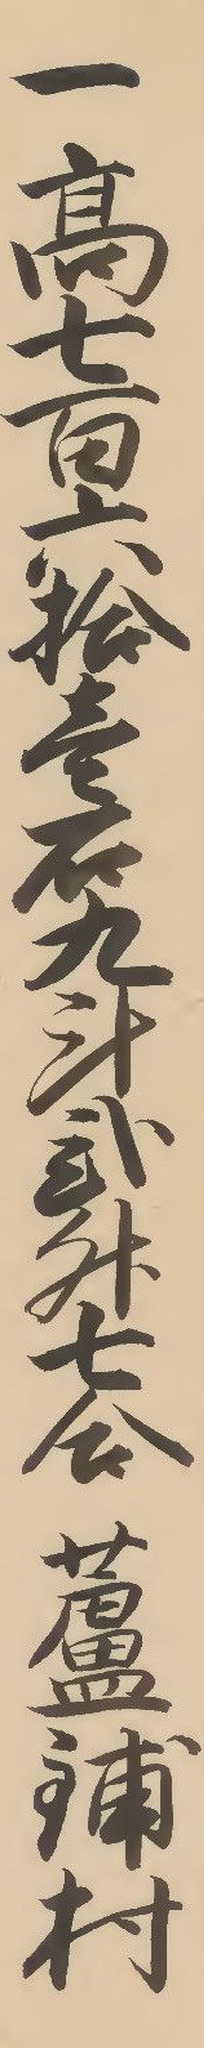一高七百六拾壱石九斗弐升七合蘆鋪村
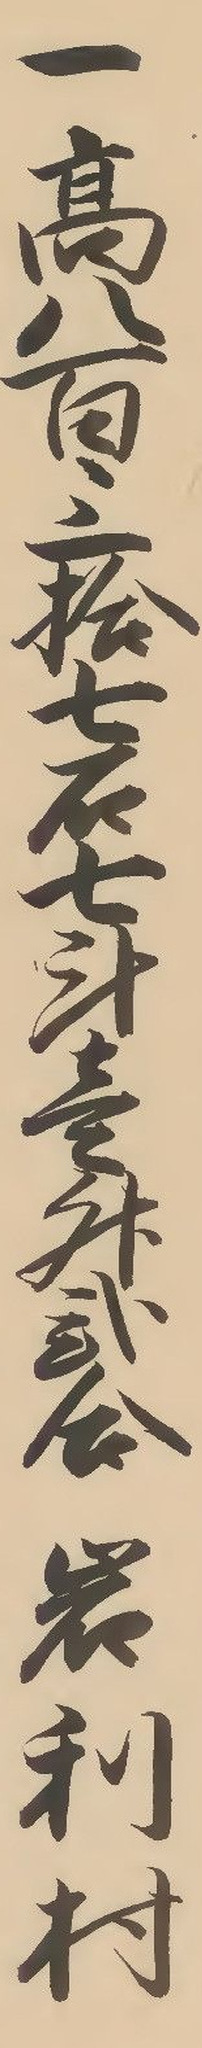一高八百三拾七石七斗壱升弐合岩利村

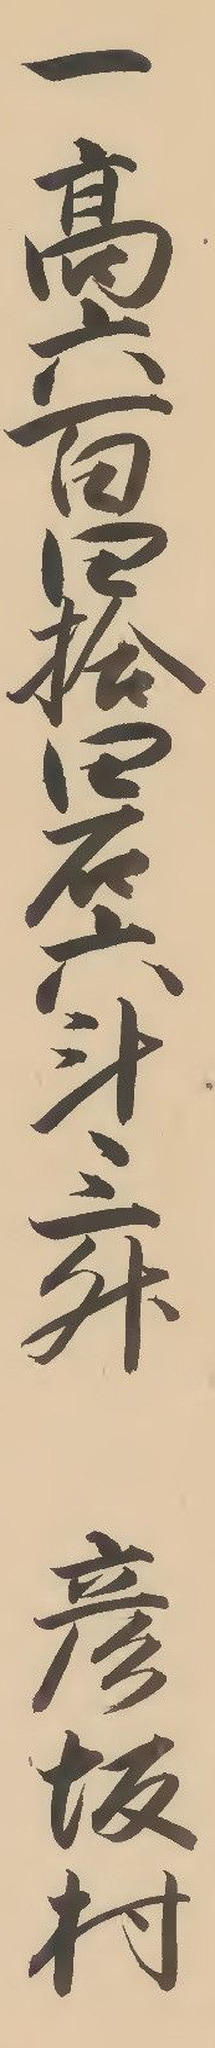一高六百四拾四石六斗三升彦坂村
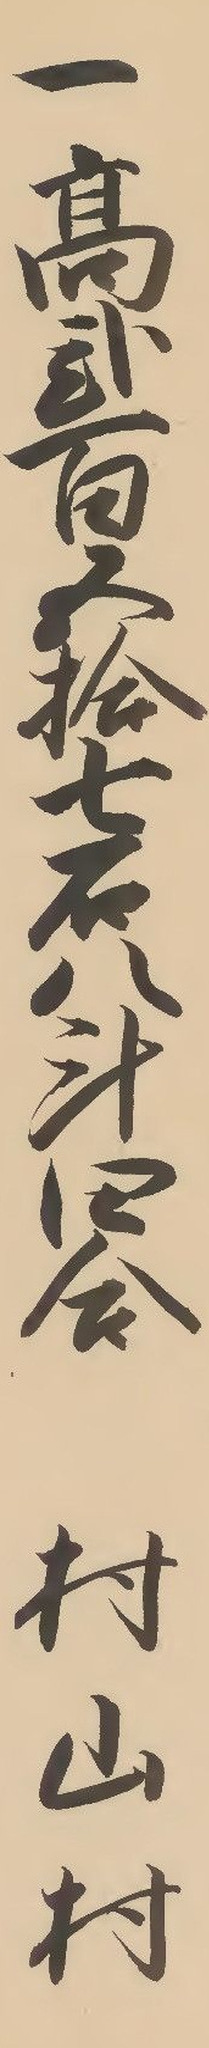一高弐百五拾七石八斗四合村山村
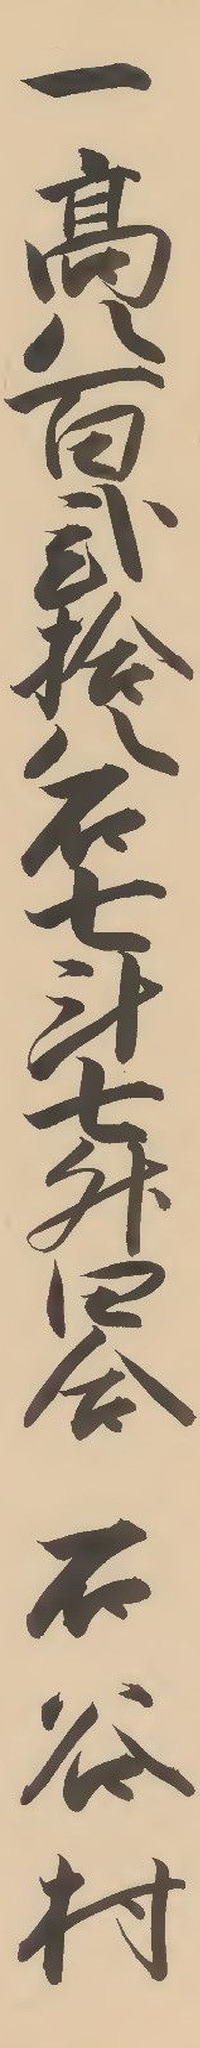一高八百弐拾八石七斗七升四合石谷村
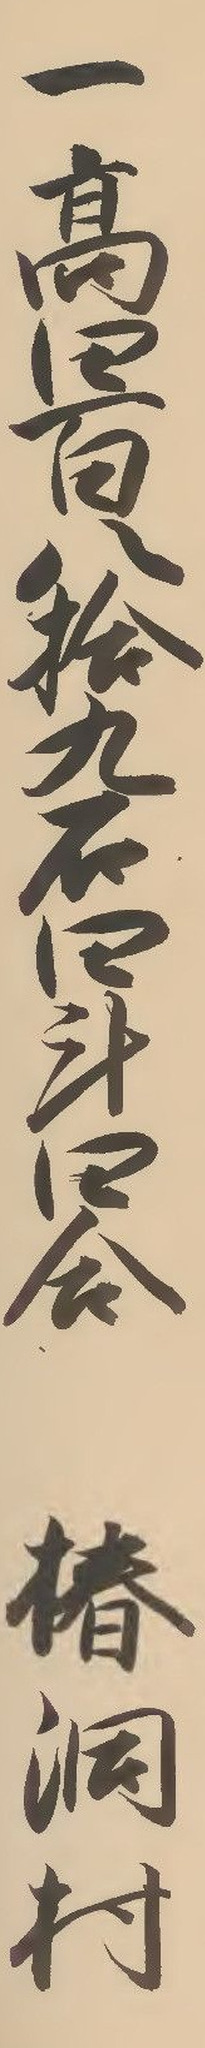一高四百八拾九石四斗四合椿洞村
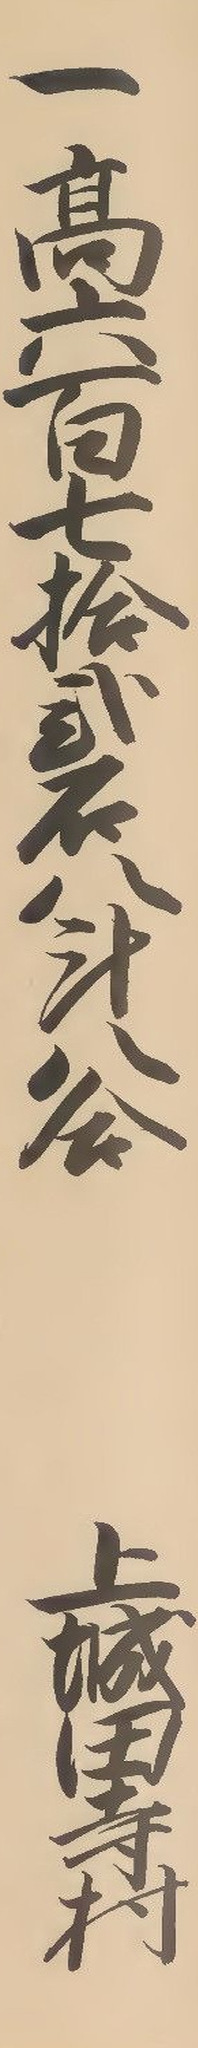一高六百七拾弐石八斗八合上城田寺村
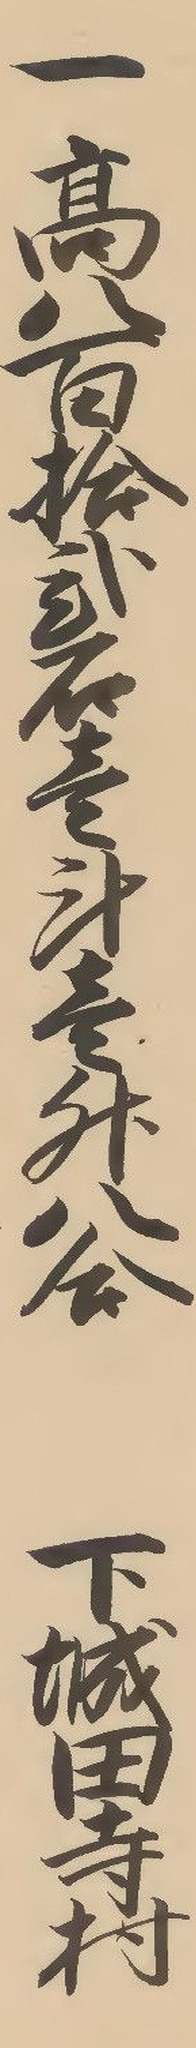一高八百拾弐石壱斗壱升八合下城田寺村
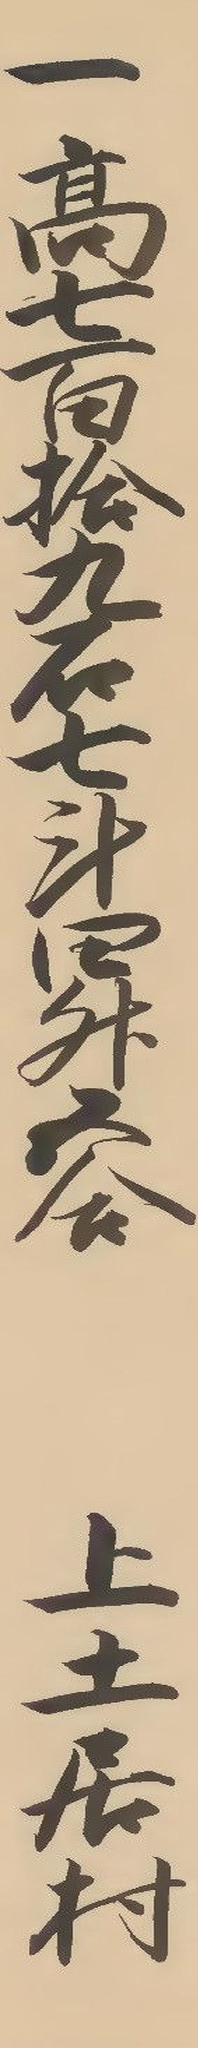一高七百拾九石七斗四升五合上土居村
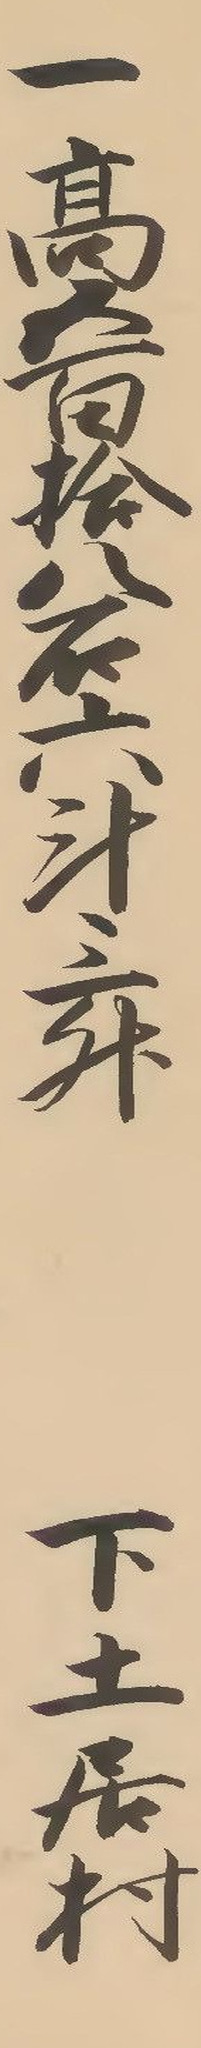一高五百拾八石六斗三升下土居村

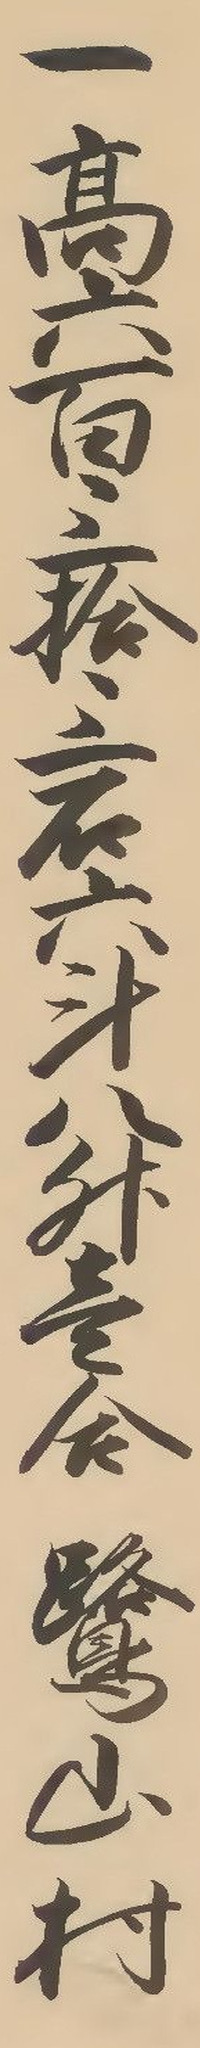一高六百三拾三石六斗八升壱合鷺山村
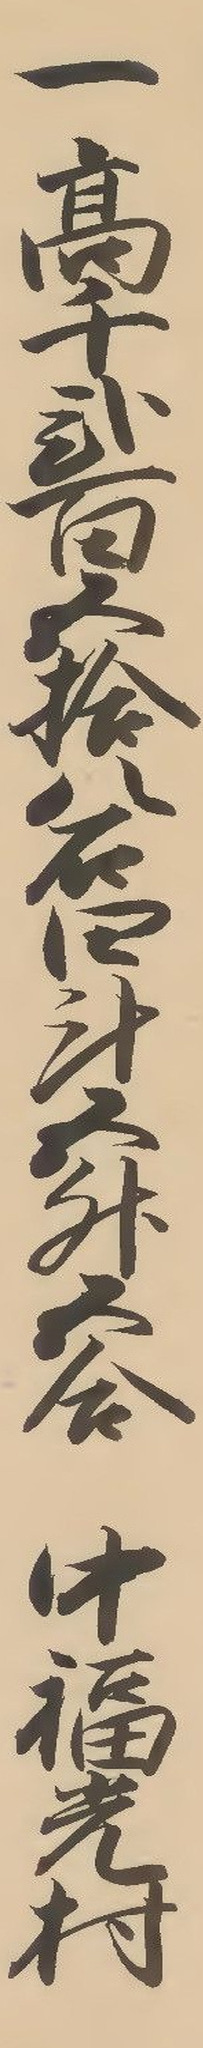一高千弐百五拾八石四斗五升五合中福光村
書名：美濃国郷帳
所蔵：国立公文書館 National Archives of Japan
